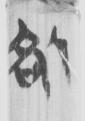咎
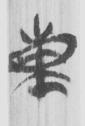東
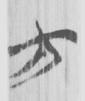方
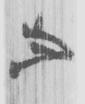之
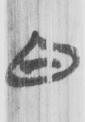白
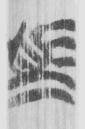馬
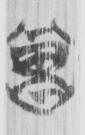曾
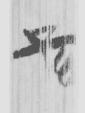孫
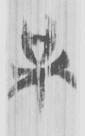某
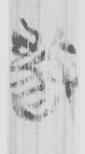敢
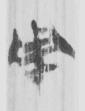用
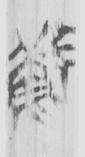鮮
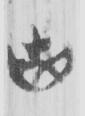鬯
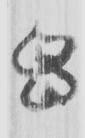玄
